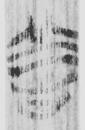善
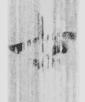才
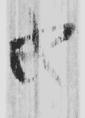女
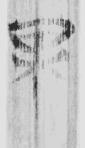果
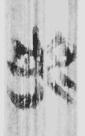若
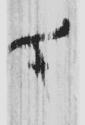氏
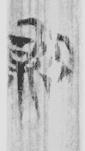則
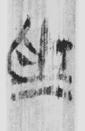爲
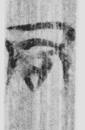君
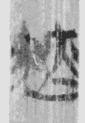勞
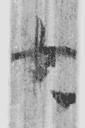才
